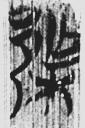○（葉）
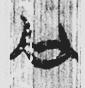公
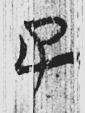子
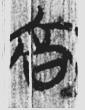高
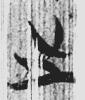之
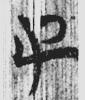子
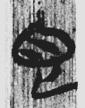見
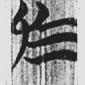於
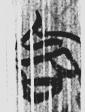命（令）
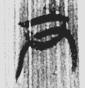尹
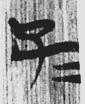子
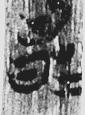旾
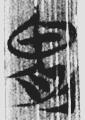{胃刀}（謂）
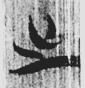之
